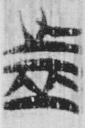者
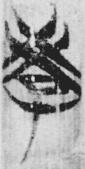○（教）
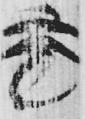而
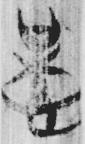○（悔）
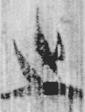之
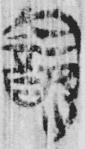○（飲）
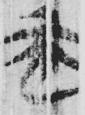而
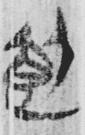飤（食）
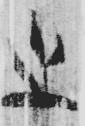之
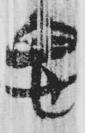思
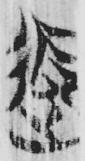役
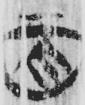百
